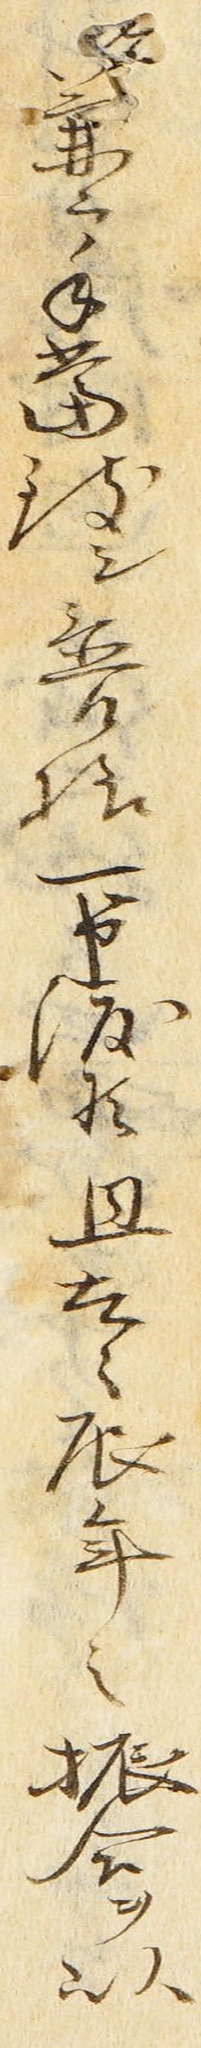は兼而手当致し置候様可申渡候且左之辰年之振合ヲ以
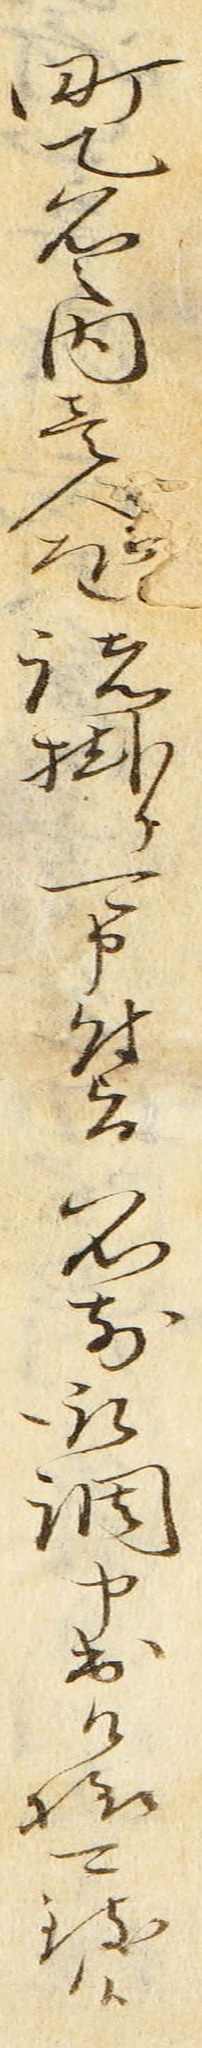町？名之内壱人を諸掛り可申候付旨名前取調申出候様可致候
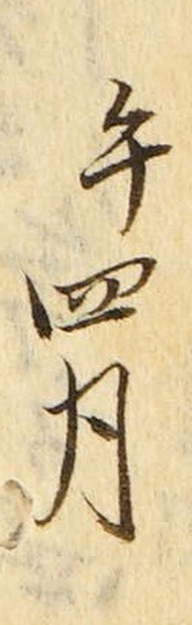午四月
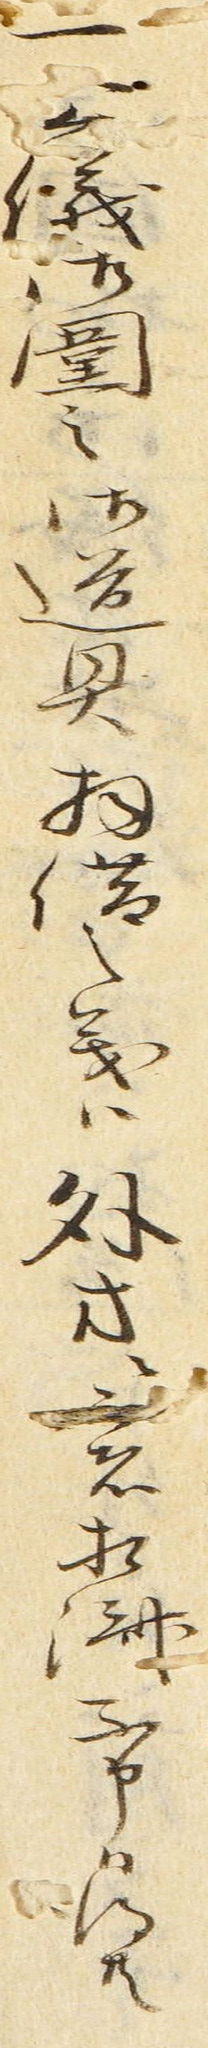一御公儀御圍之御道具拝借之義は外等に而は相済不申候得共

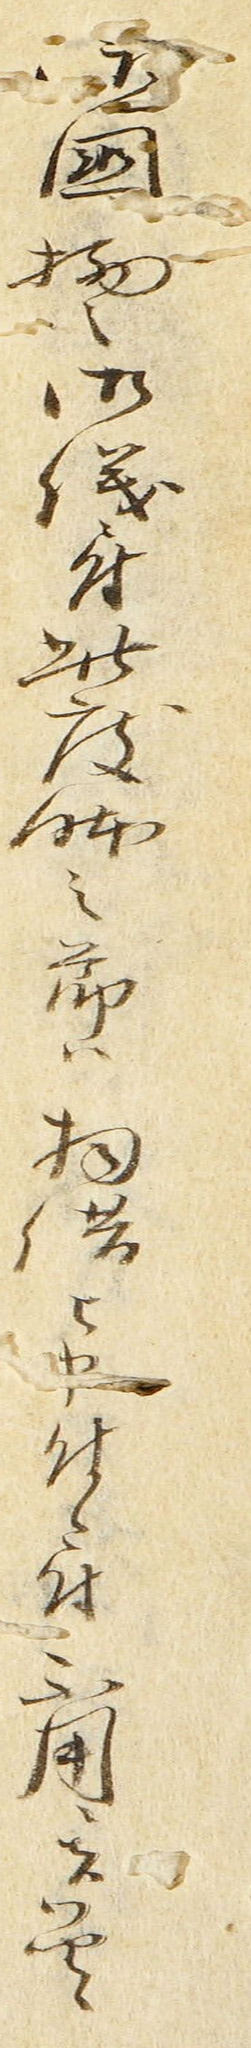取国柄之儀に付此度躰之節は物借と申付くに付不用には御座候
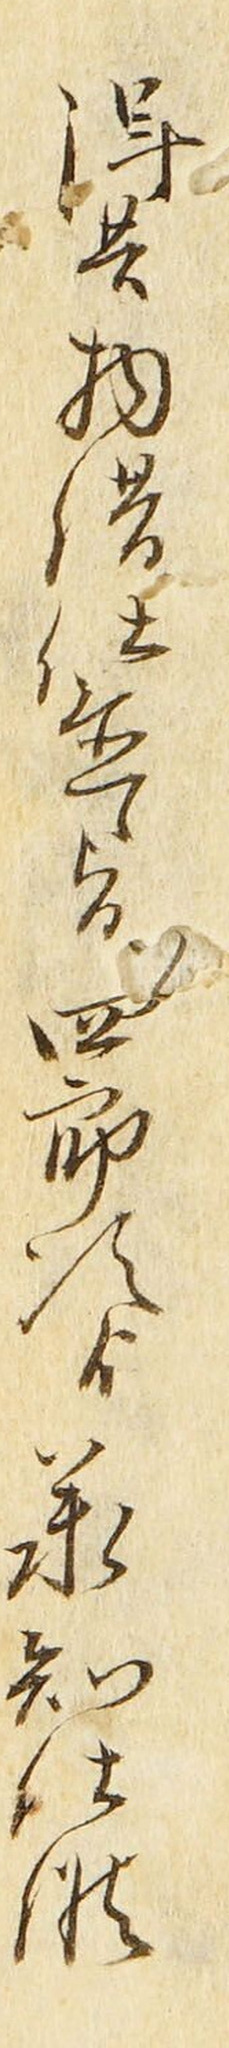得共物借仕置候旨四郎次ゟ承知仕候
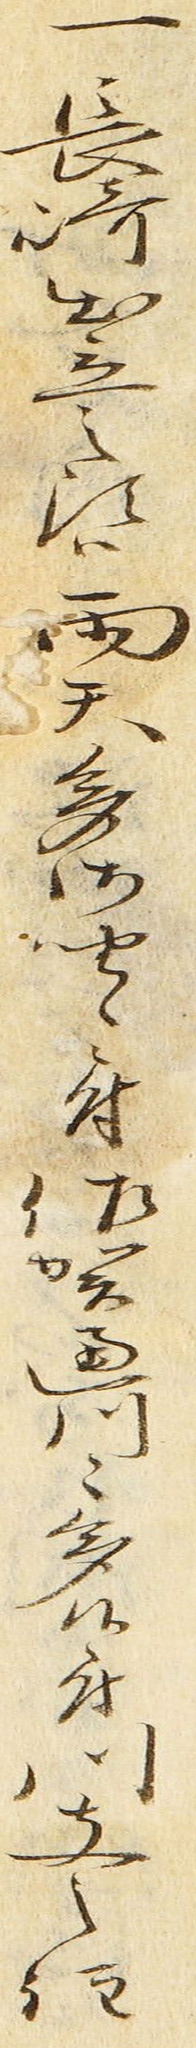一長崎出立之頃は雨天多御座候に付佐賀通川通川多候に付川支之程
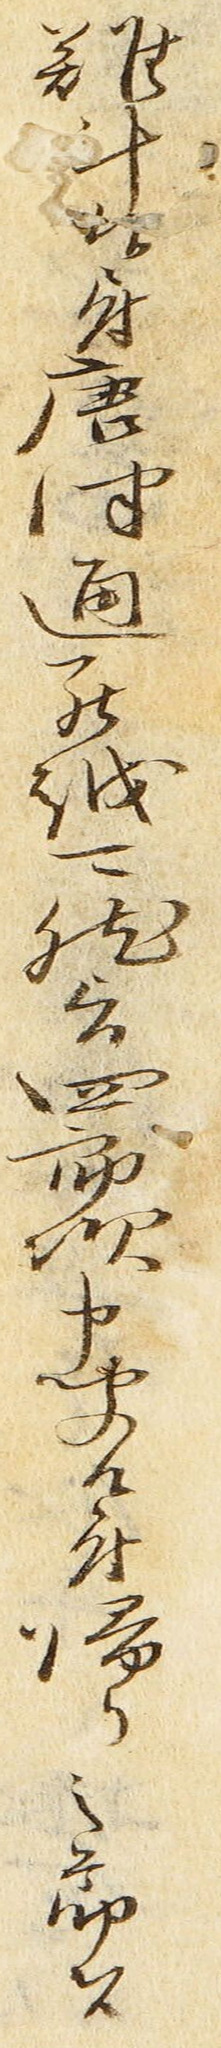難斗候に付唐津通罷越可然旨四郎次申聞候に付帰り之節は
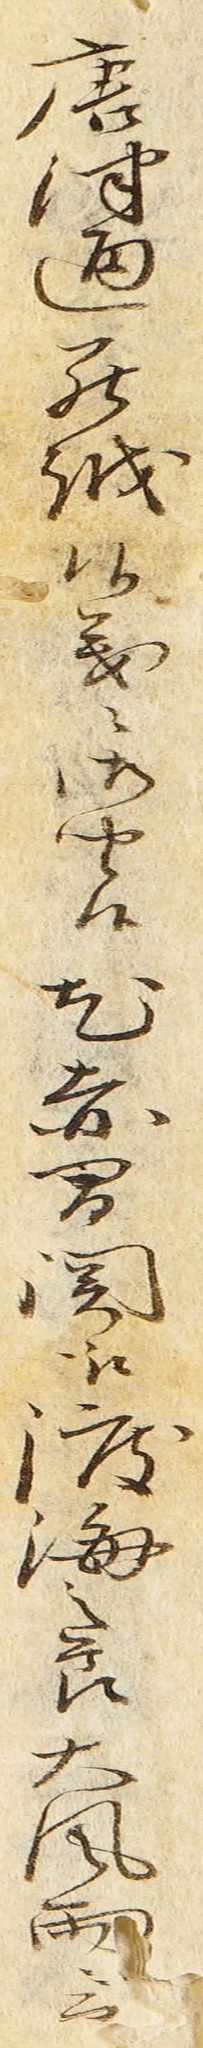唐津通罷越候義に御座候尤赤間関江渡海之節大風雨に而
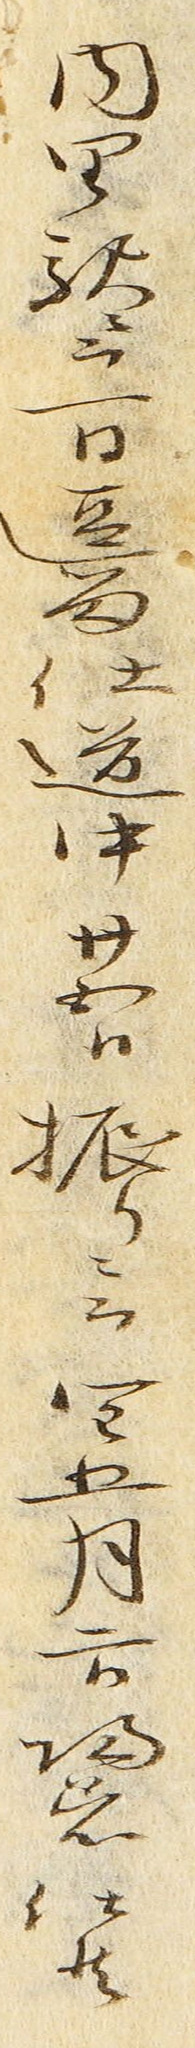内里駅に而一日逗留仕道中廿五日振りに而寅五月二日帰着仕候
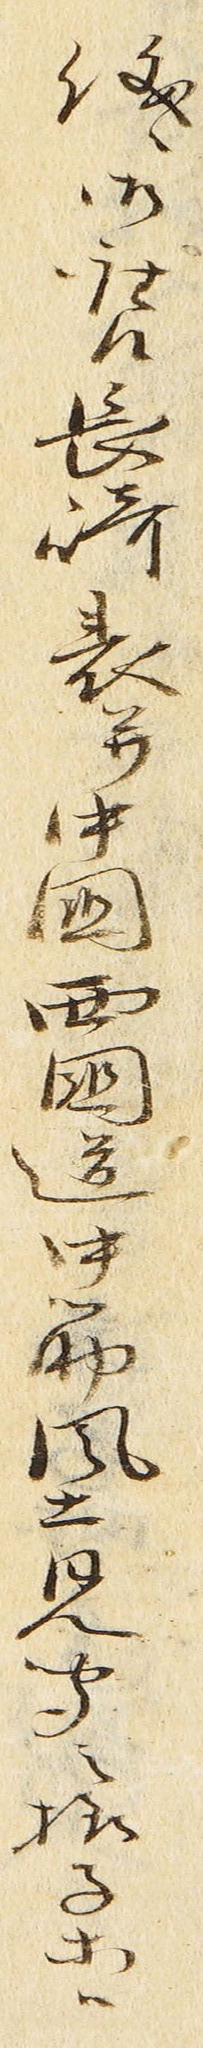儀に御座候長崎表並中国西国道中筋風土見聞之様子等は
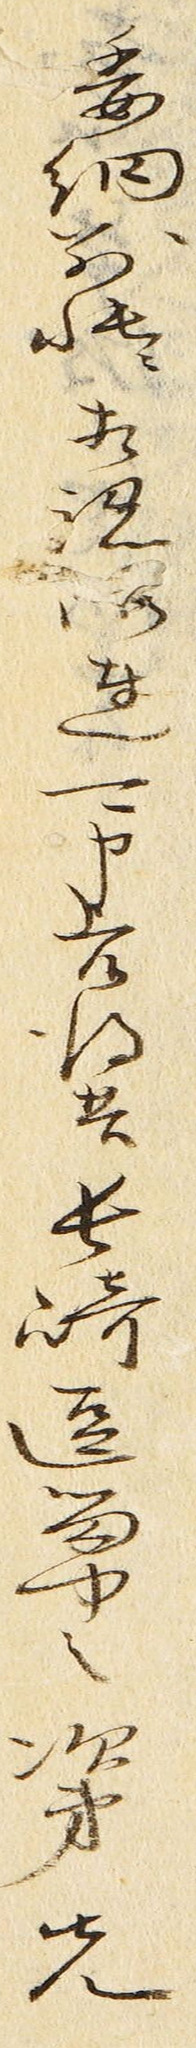委細は前帳に相認？連可申上候得共長崎逗留中之次第先

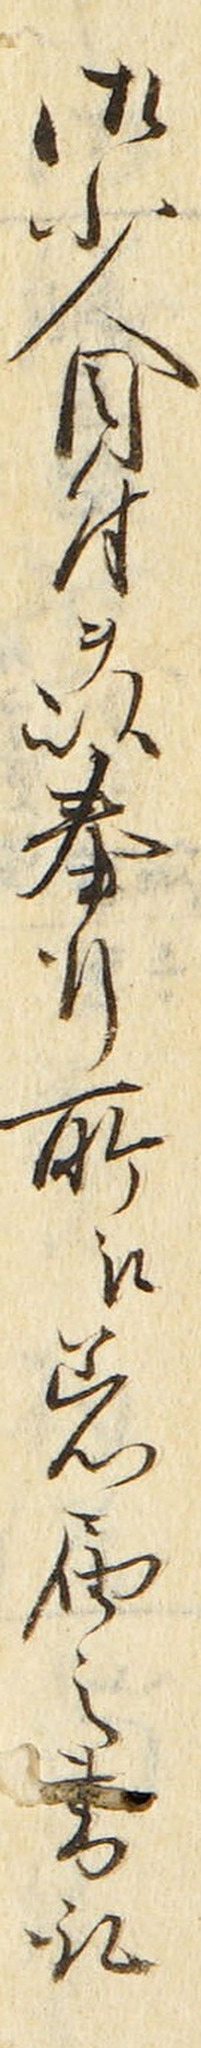御小人目付ヲ以奉行所江差届之書取
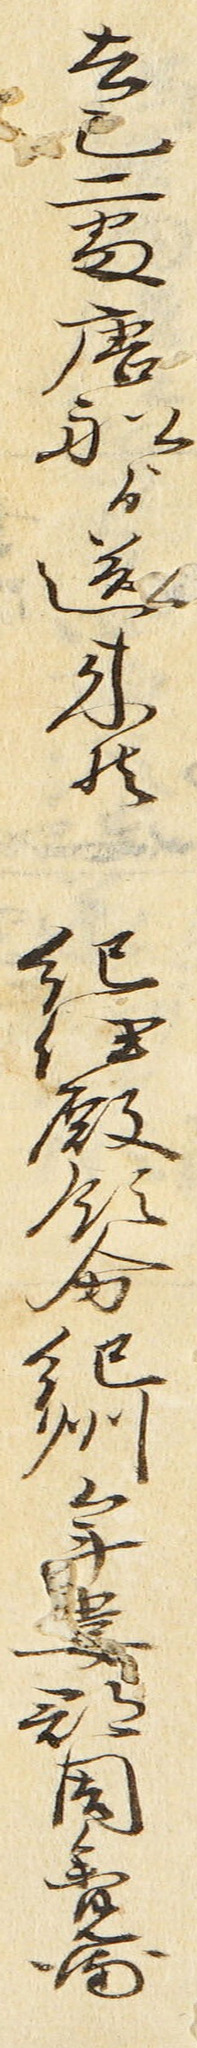左？ニ叟唐船ゟ送来候紀伊殿領分紀州牟婁郡周
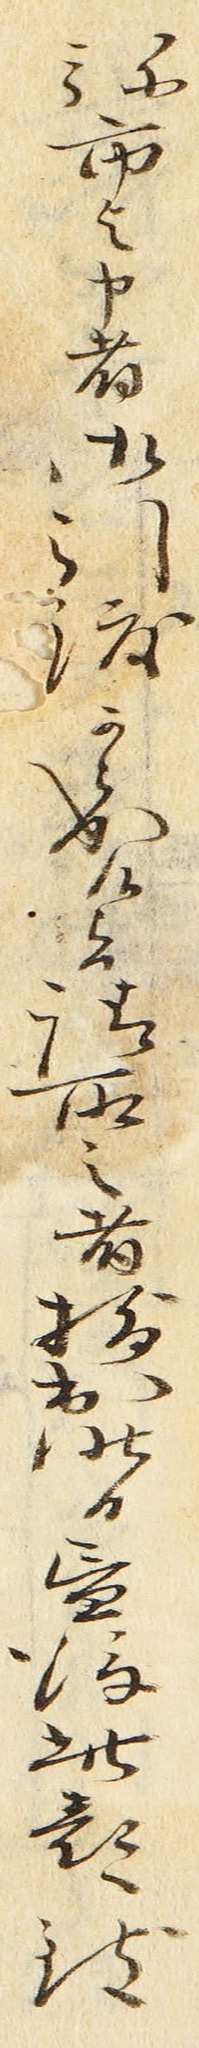弥市と申者御引渡可被成候旨請所之者指出昨日昼後此表へ致
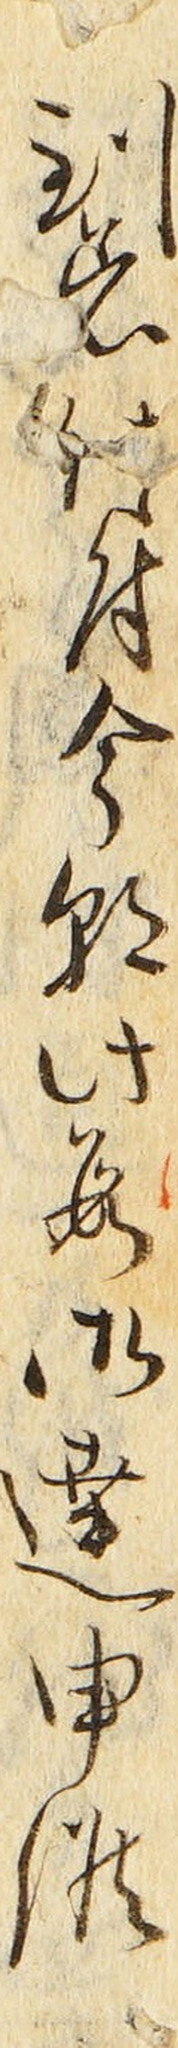到着？候付今朝此？御達申候
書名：漂流人弥市之記
